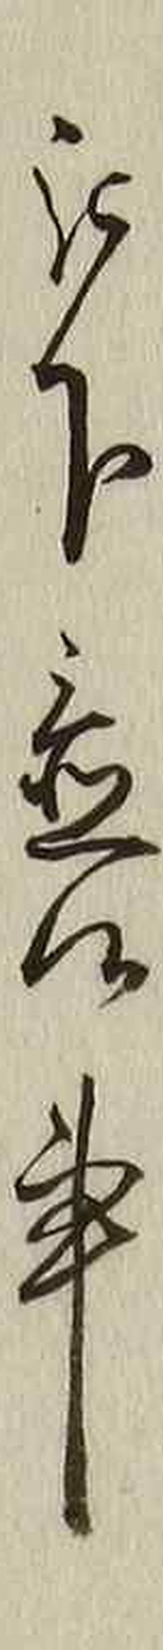被下置候事
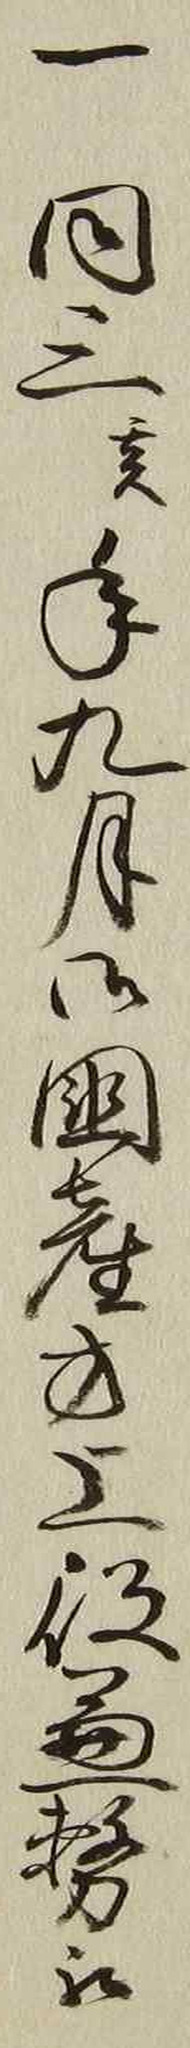一同三亥年九月御国産方上役兼務被
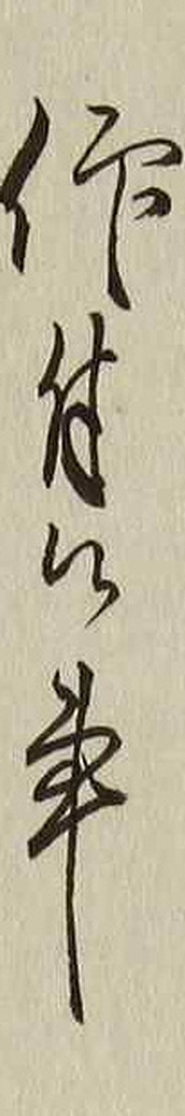仰付候事
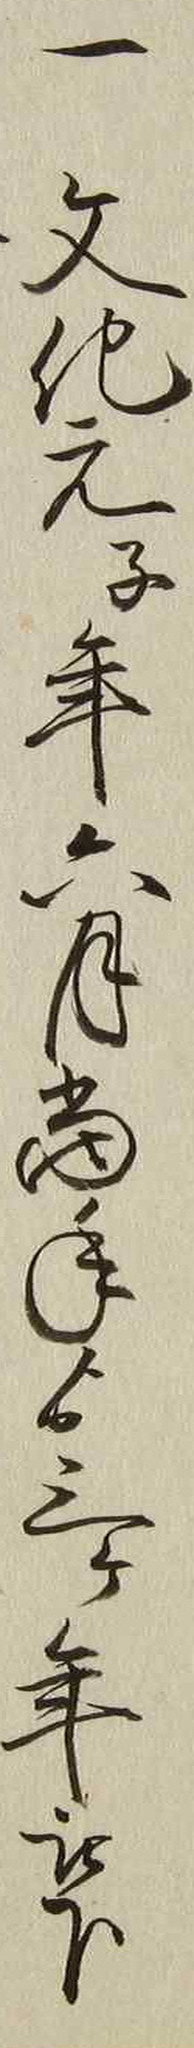一文化元子年六月当年ゟ三ケ年被下
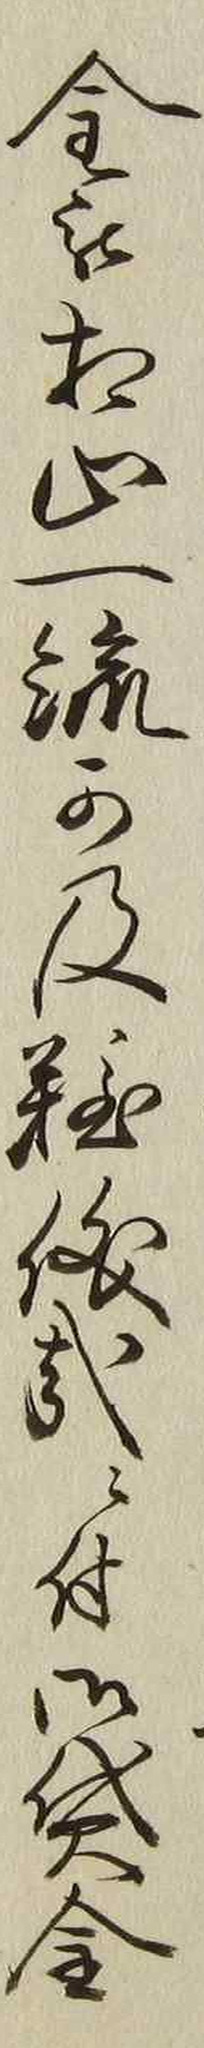金被相止一統可及難儀哉ニ付御貸金
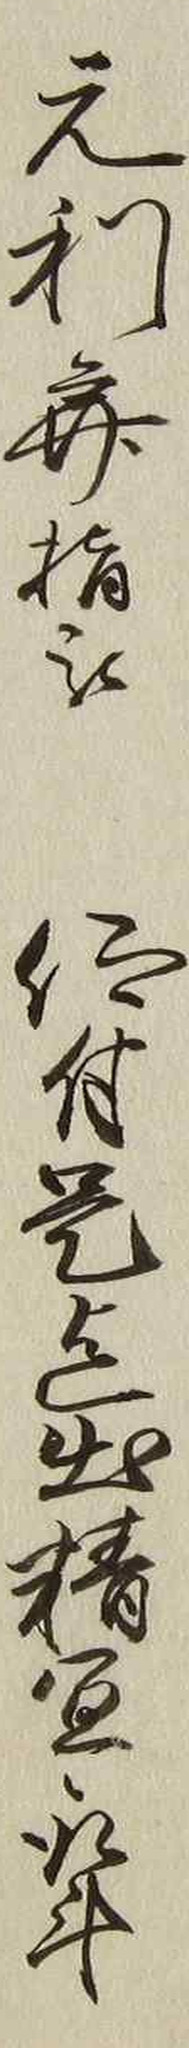元利弃指被仰付是迄出精宜取斗
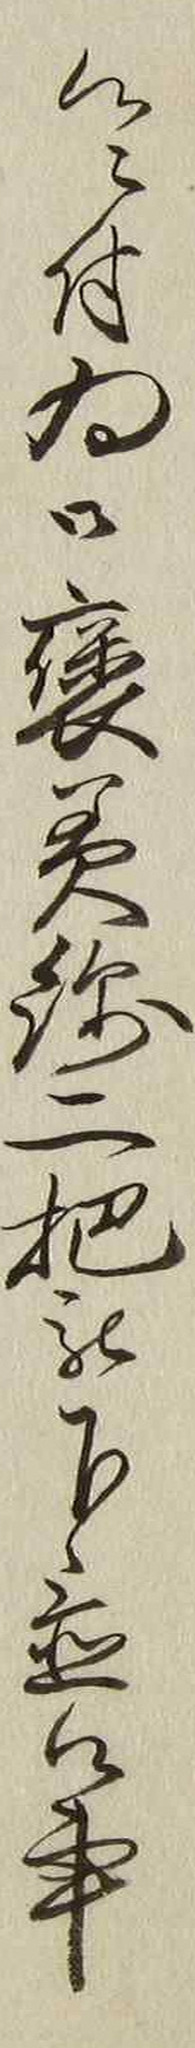候ニ付為御褒美綿二把被下置候事
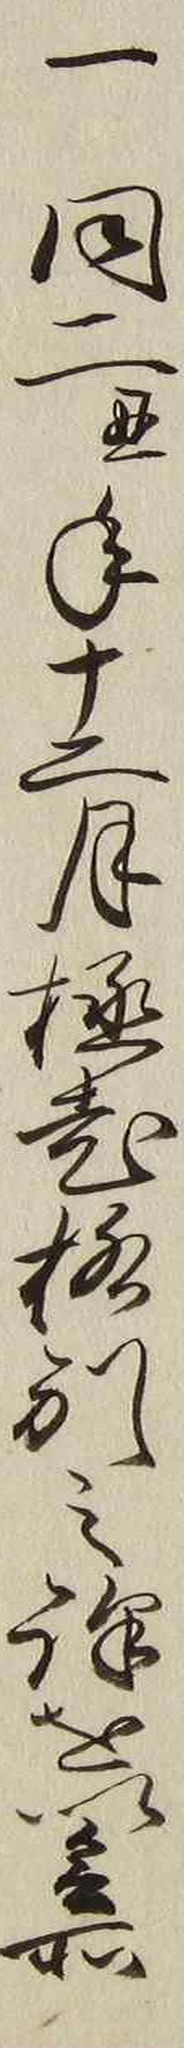一同二丑年十二月極老格別之訳を以会所
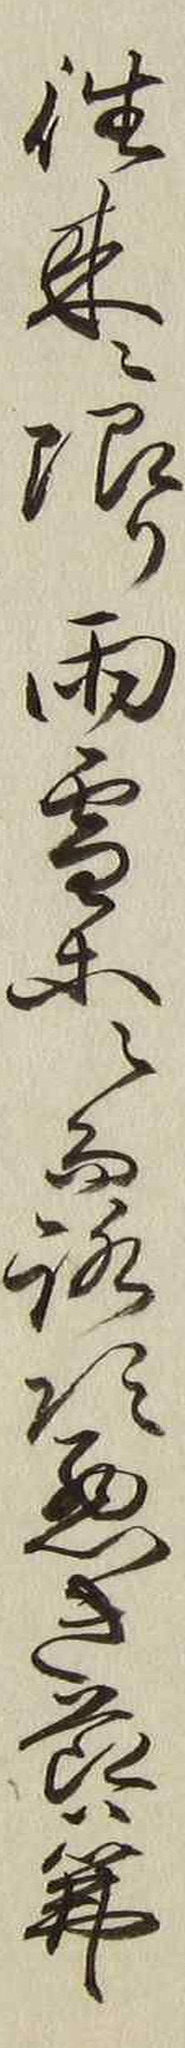往来ニ限り雨雪等ニ而路次悪き節ハ笰
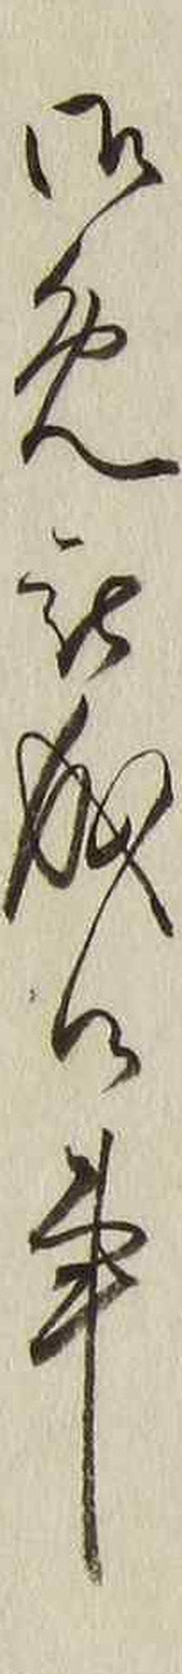御免被成候事
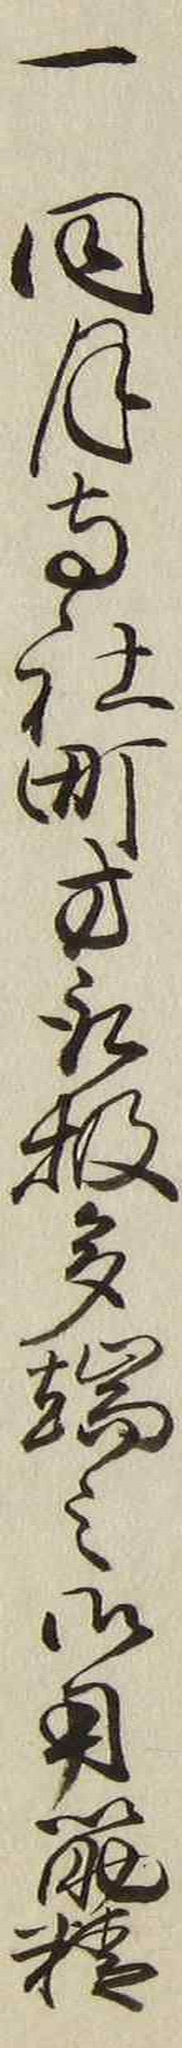一同月寺社町方取扱多端之御用筋精
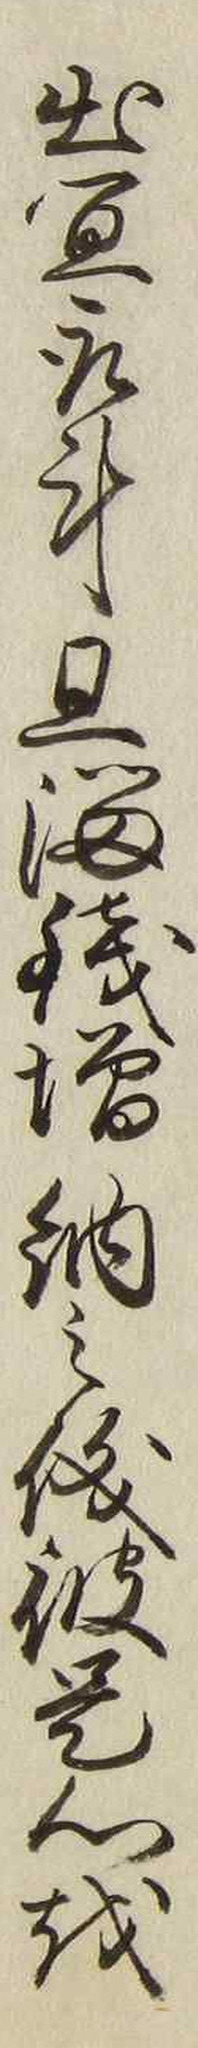出宜取斗旦溜銭増納之儀彼是心を

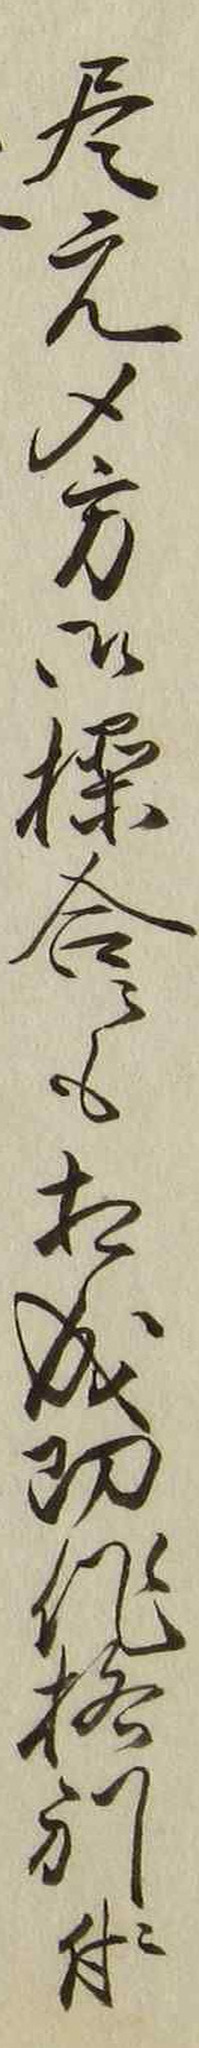尽元〆方御操合ニも相成功作格別ニ付
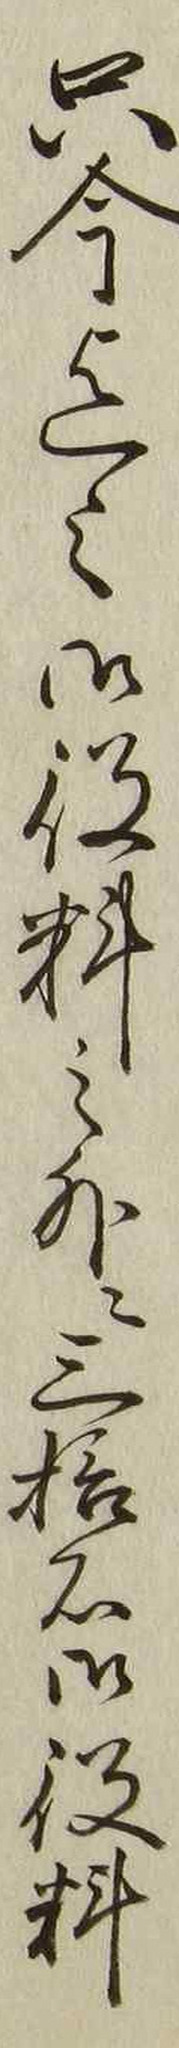只今迄之御役料之外ニ三拾石御役料
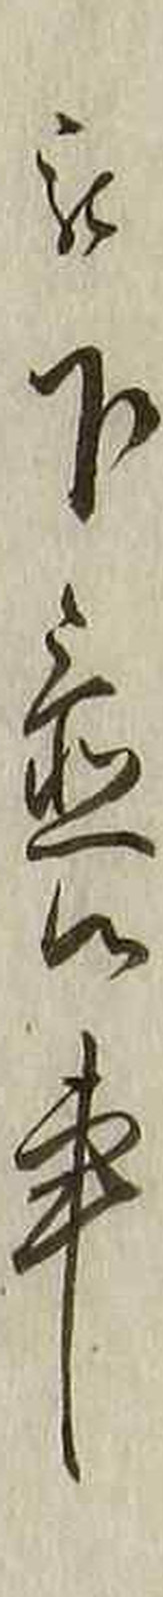被下置候事
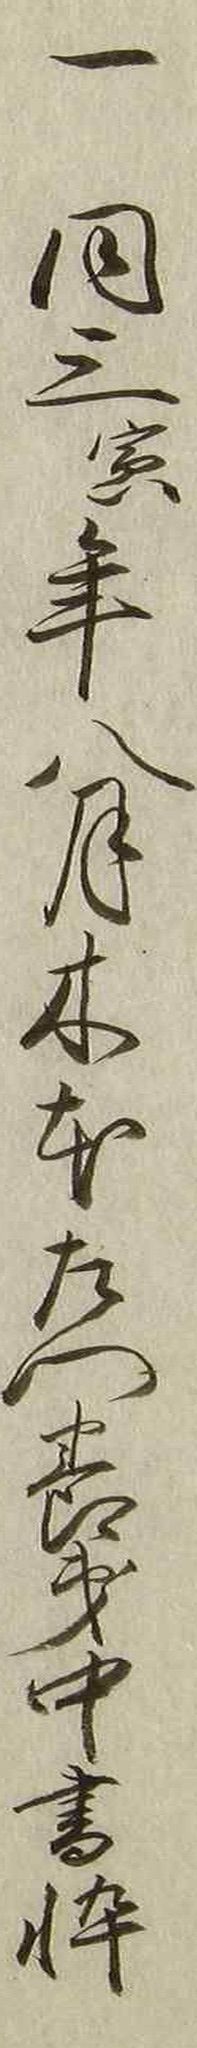一同三寅年八月木本左門養第中書忰
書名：諸士系譜　巻之21　い之部21
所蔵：会津若松市立会津図書館
